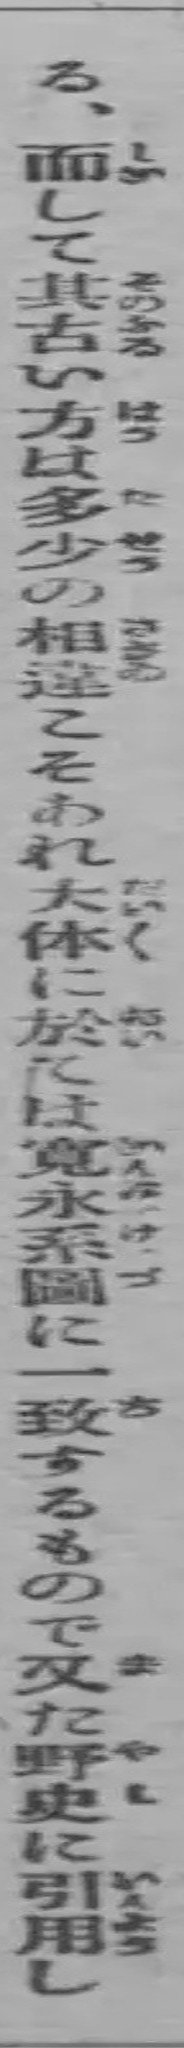る、而して其古い方は多少の相違こそあれ大体に於ては寛永系図に一致するもので又た野史に引用し
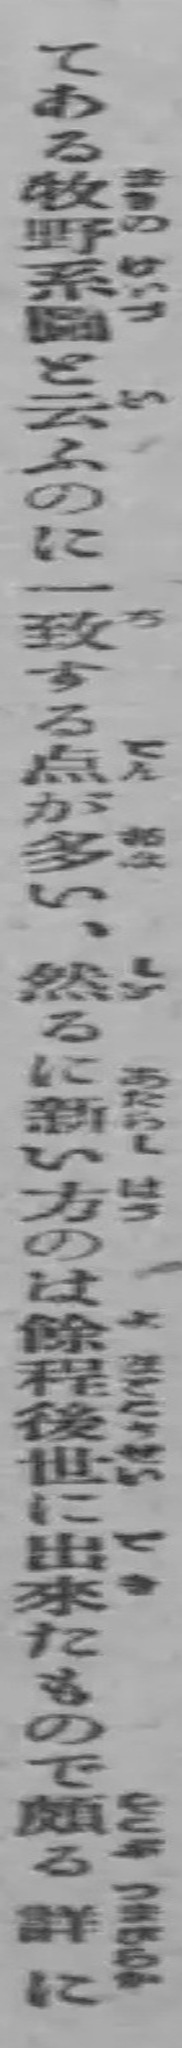てある牧野系図と云ふのに一致する点が多い、然るに新い方のは余程後世に出来たもので頗る詳に
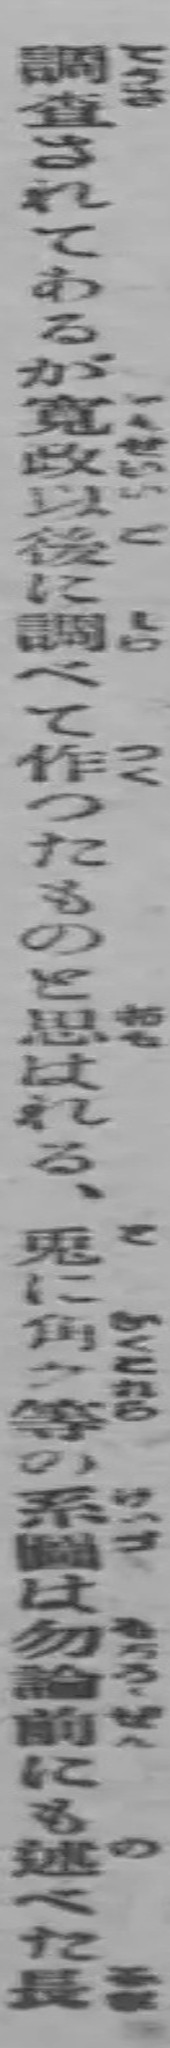調査されてあるが寛政以後に調べて作つたものと思はれる、兎に角之等の系図は勿論前にも述べた長
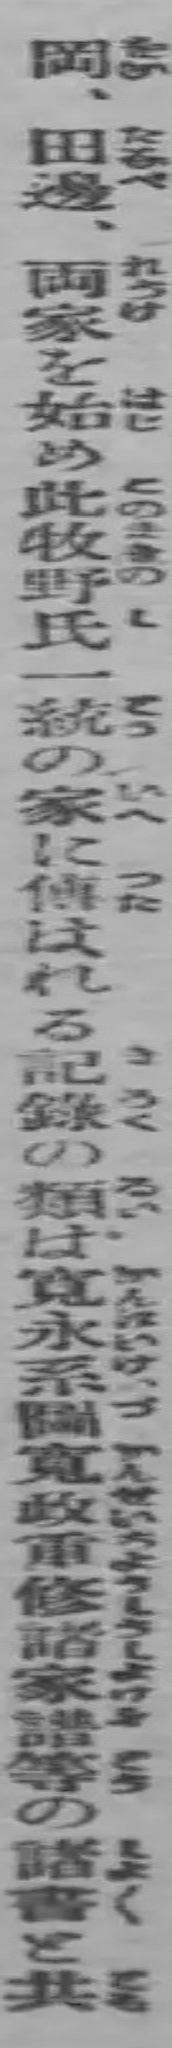岡、田辺、両家を始め此牧野氏一統の家に伝はれる記録の類は寛永系図寛政重修諸家譜等の諸書と共
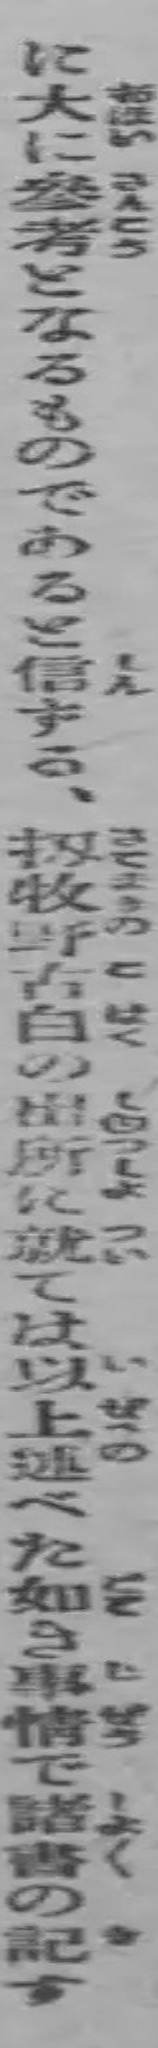古白の素性に大に参考となるものであると信ずる、扨牧野古白の出所に就ては以上述べた如き事情で諸書の記す
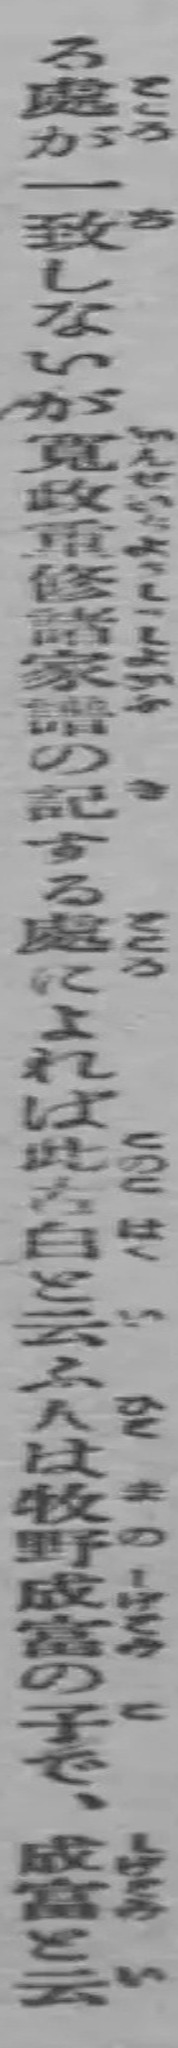る処が一致しないが寛政重修諸家譜の記する処によれば此古白と云ふ人は牧野成富の子で、成富と云
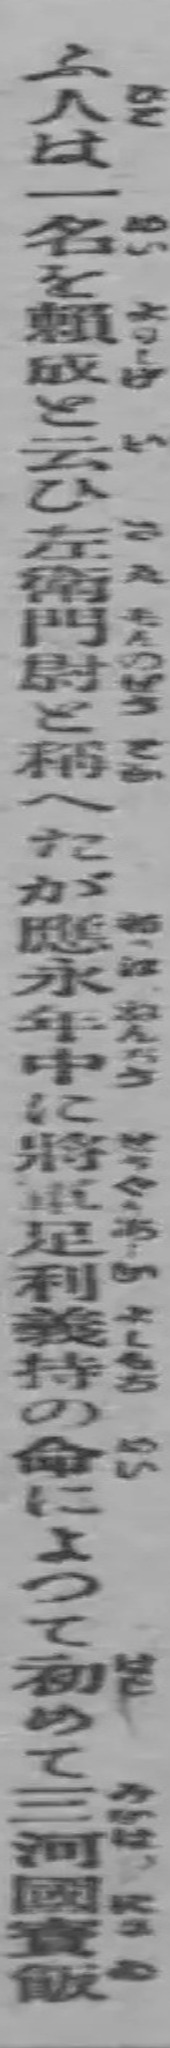ふ人は一名を頼成と云ひ左衛門尉と称へたが応永年中に将軍足利義持の命によつて初めて三河国宝飯
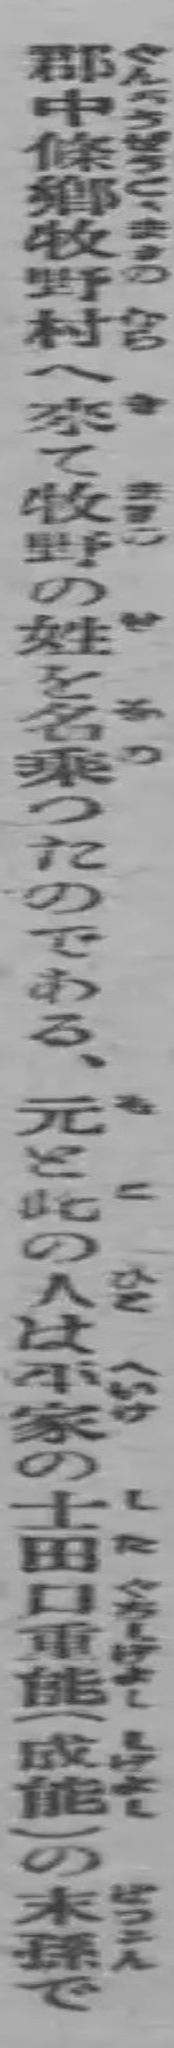牧野成富郡中條郷牧野村へ来て牧野の姓を名乗つたのである、元と此の人は平家の士田口重能(成能)の末孫で
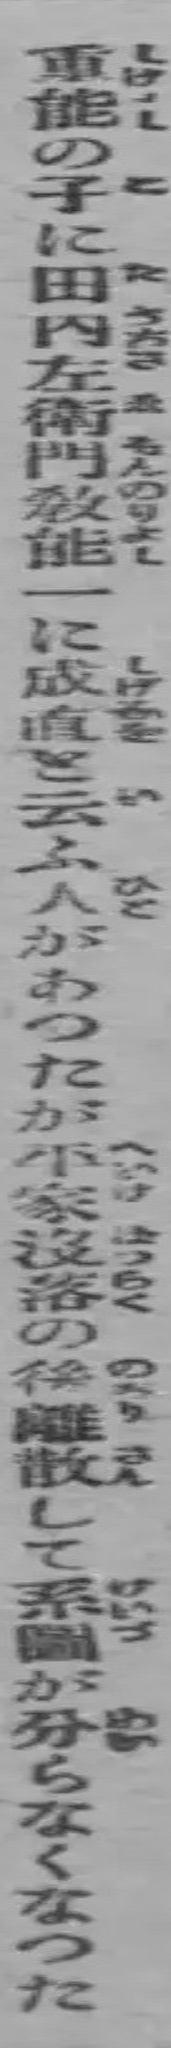重能の子に田内左衛門教能一に成直と云ふ人があつたが平家没落の後離散して系図が分らなくなつた
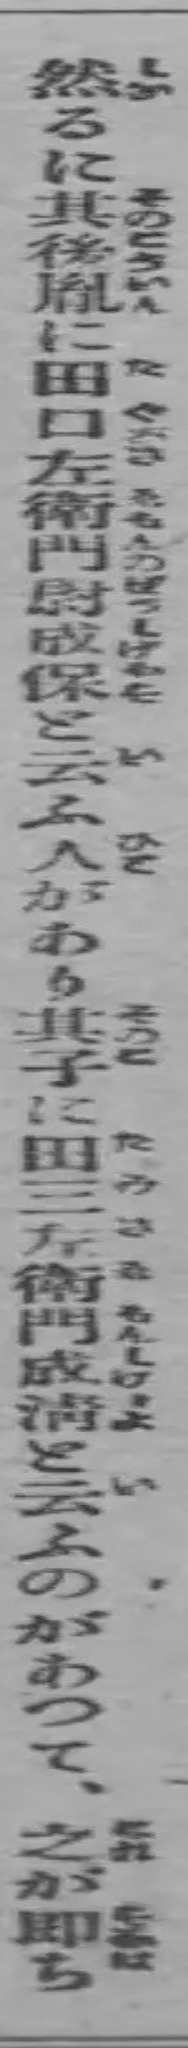然るに其後胤に田口左衛門尉成保と云ふ人があり其子に田三左衛門成清と云ふのがあつて、之が即ち
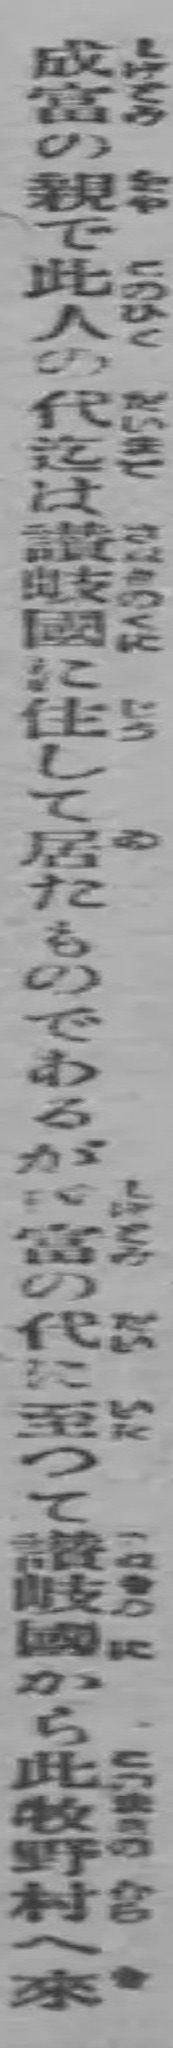成冨の親で此人の代迄は讃岐国に住して居たものであるが成冨の代に至つて讃岐国から此牧野村へ来
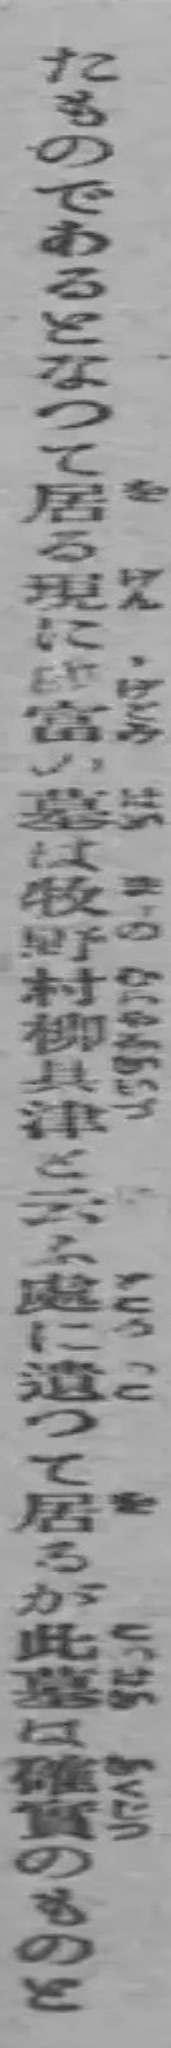成富の墳墓たものであるとなつて居る現に成冨の墓は牧野村柳貝津と云ふ処に遺つて居るが此墓は確実のものと
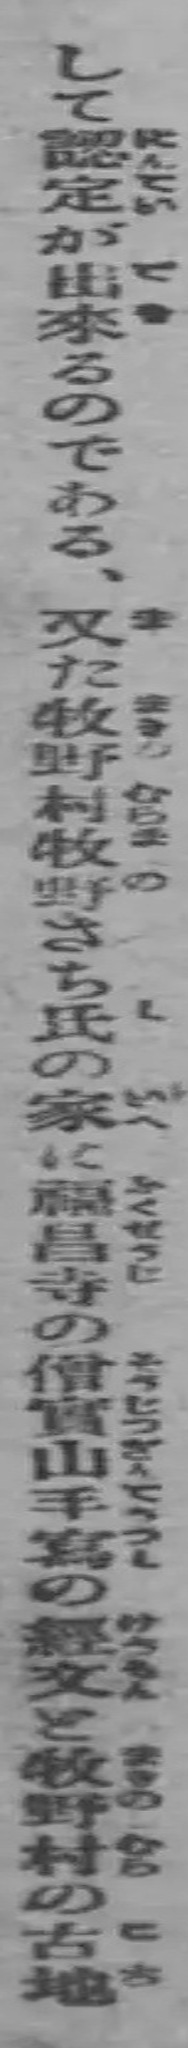して認定が出来るのである、又た牧野村牧野さち氏の家に福昌寺の僧実山手写の経文と牧野村の古地
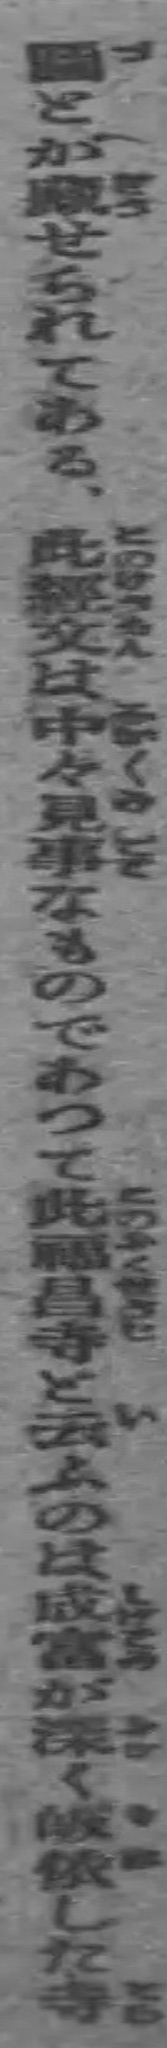福昌寺図とが蔵せられてある、此経文は中々見事なものであつて此福昌寺と云ふのは成富が深く皈依した寺
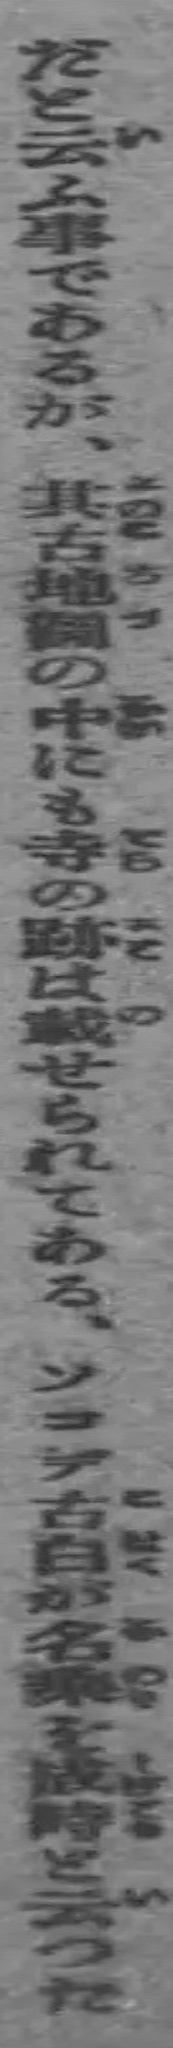だと云ふ事であるが、其古地図の中にも寺の跡は載せられてある、ソコデ古白が名乗を成時と云つた
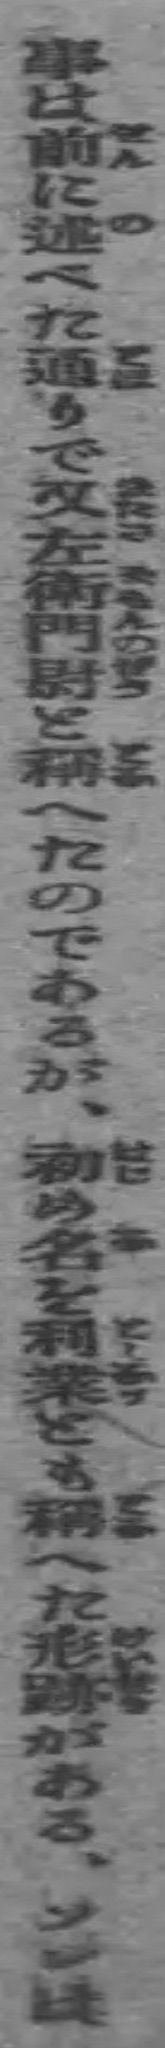事は前に述べた通りで又左衛門尉と称へたのであるが、初め名を利業とも称へた形跡がある、ソレは
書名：豊橋市史談
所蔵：国立国会図書館 National Diet Library, JAPAN
